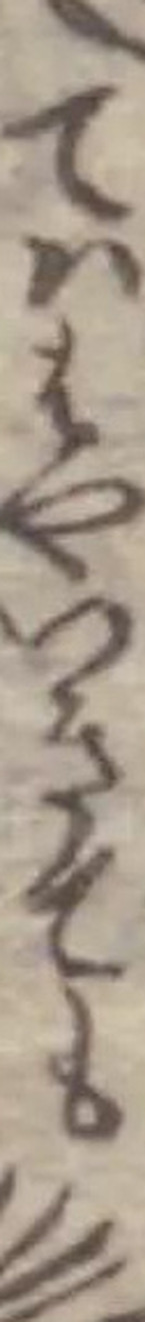てははやいきても

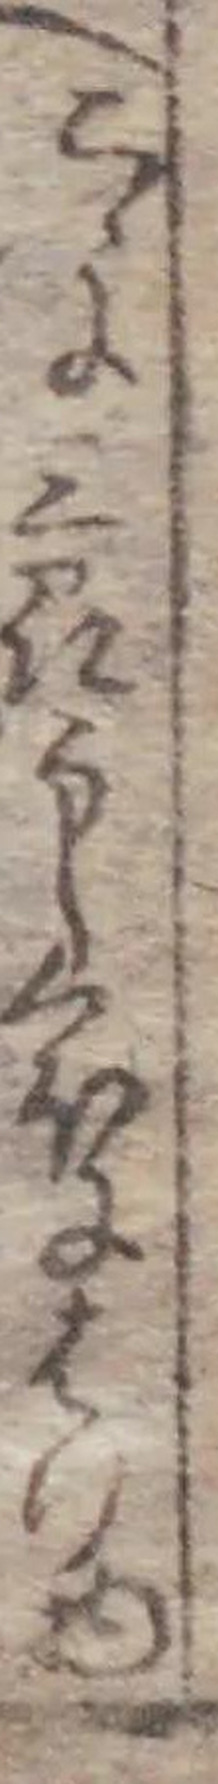こゝに三州うしくほにはけ物
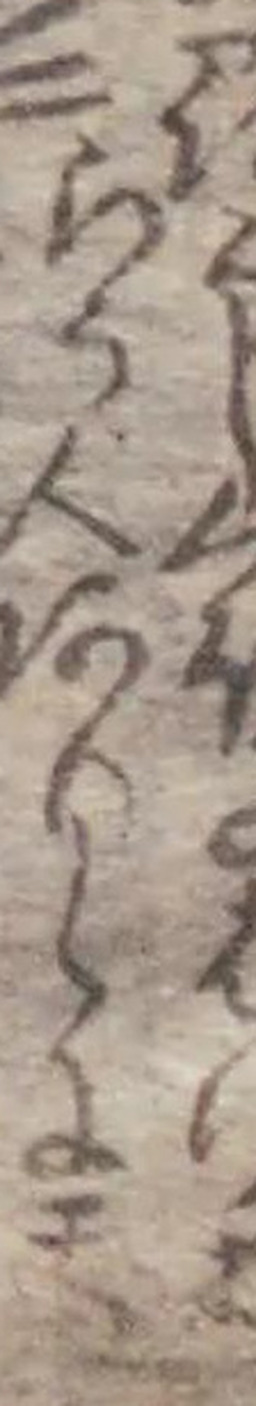らう人ありしに天
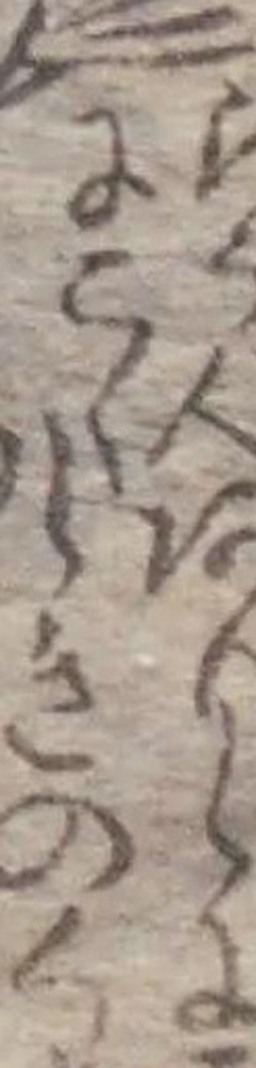にこくしきのくも
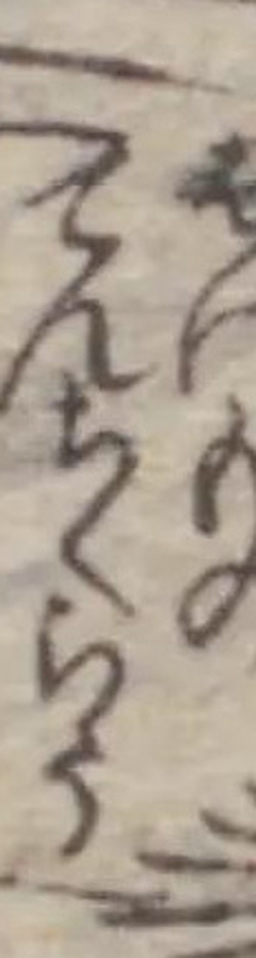てんちくらう
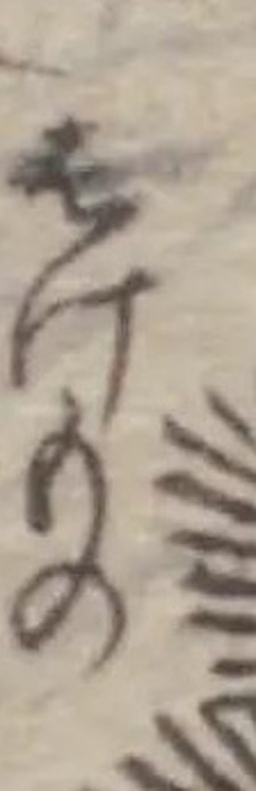はけもの
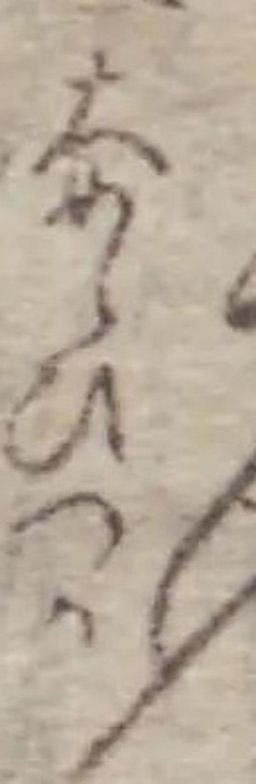大めしひつか
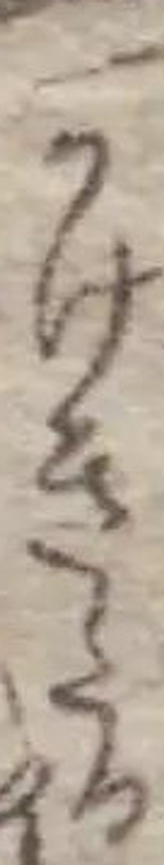かけきたる
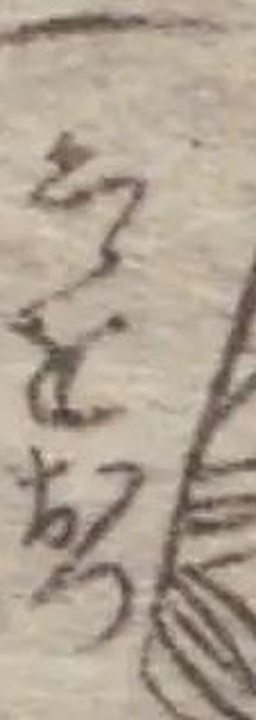こゝをおつ
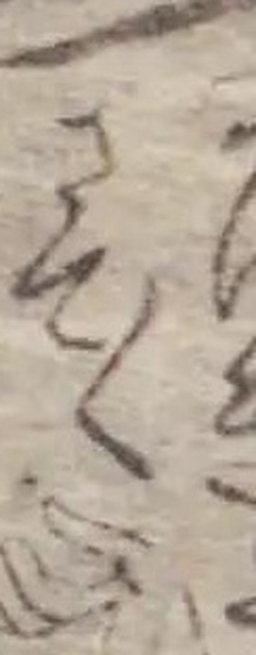さて〳〵

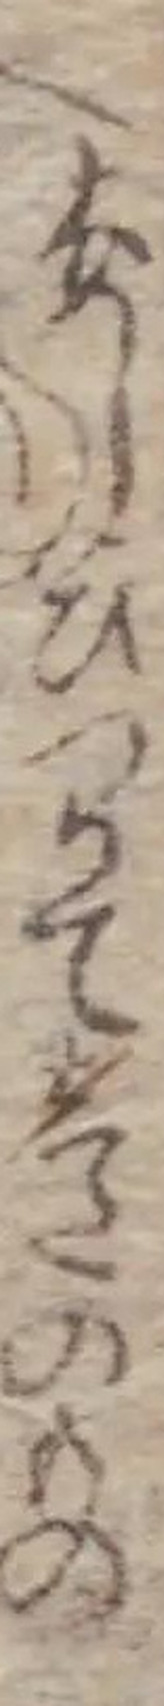大めしひつかてしたのもの
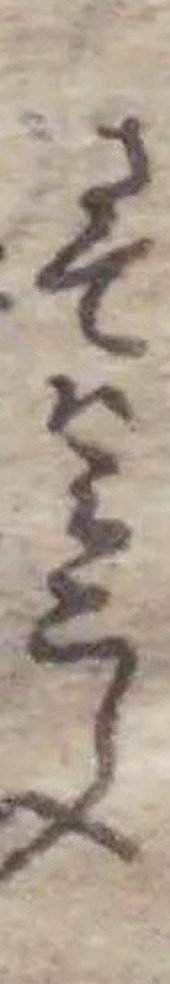さてはみこし入
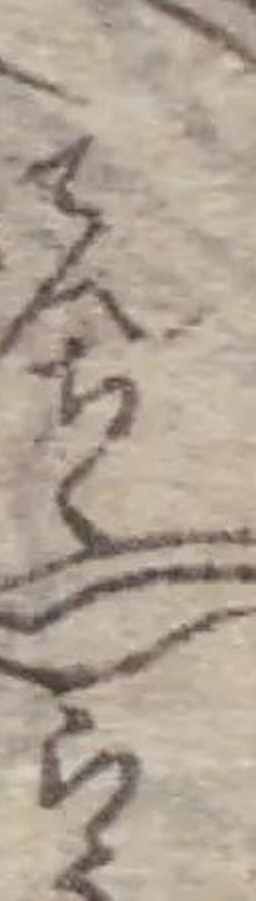てんちくらう
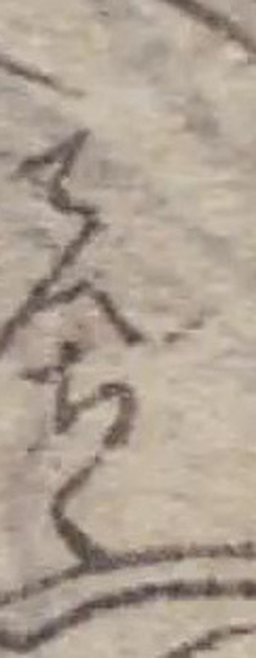てんちく
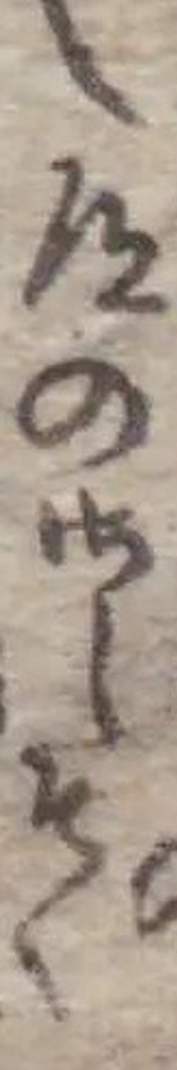道の御しそく
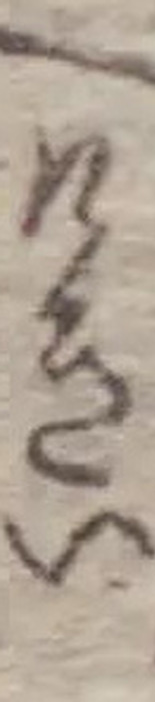けきい
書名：化物三ツ目大ほうい 2巻
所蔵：国立国会図書館 National Diet Library, JAPAN
